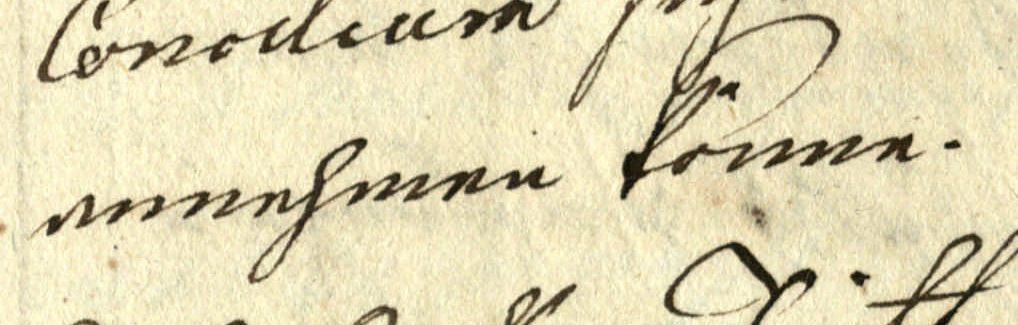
annehmen könne.
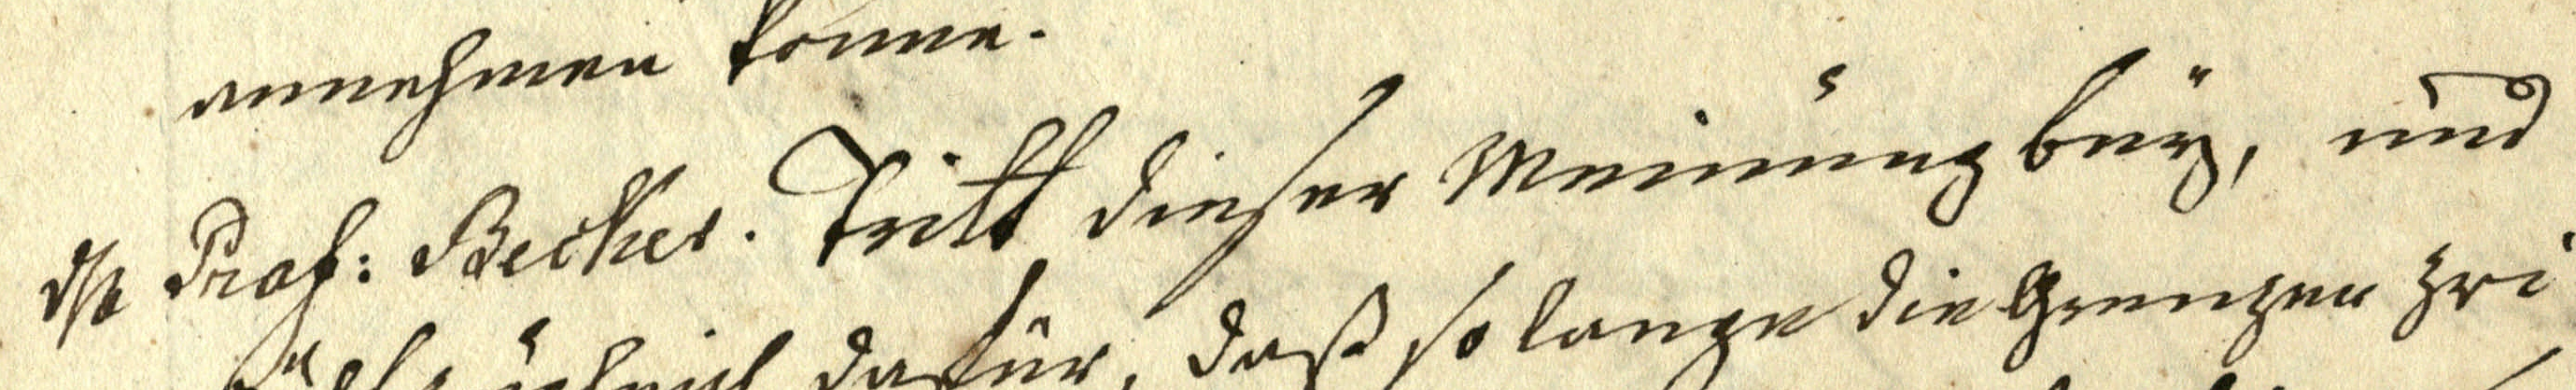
dh. Prof. Becker. Tritt dieser Meinung beÿ, und
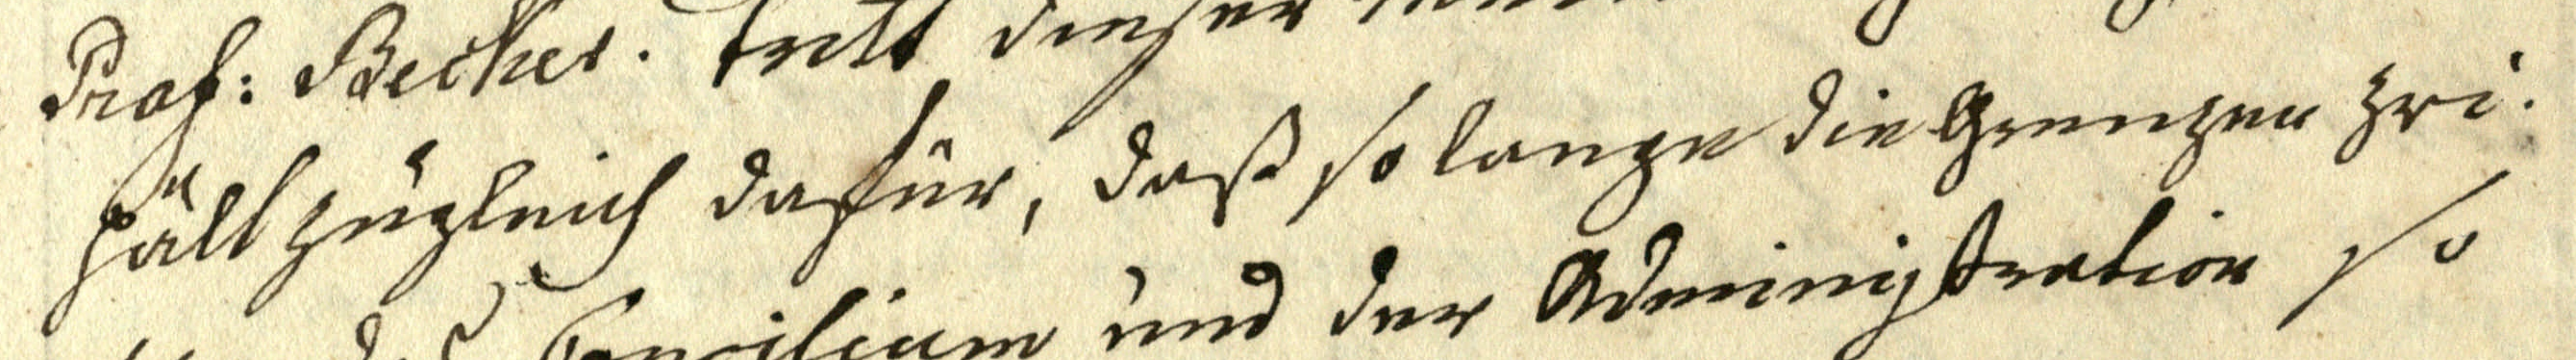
hält zugleich dafür, daß so lange die Grenzen zwi¬
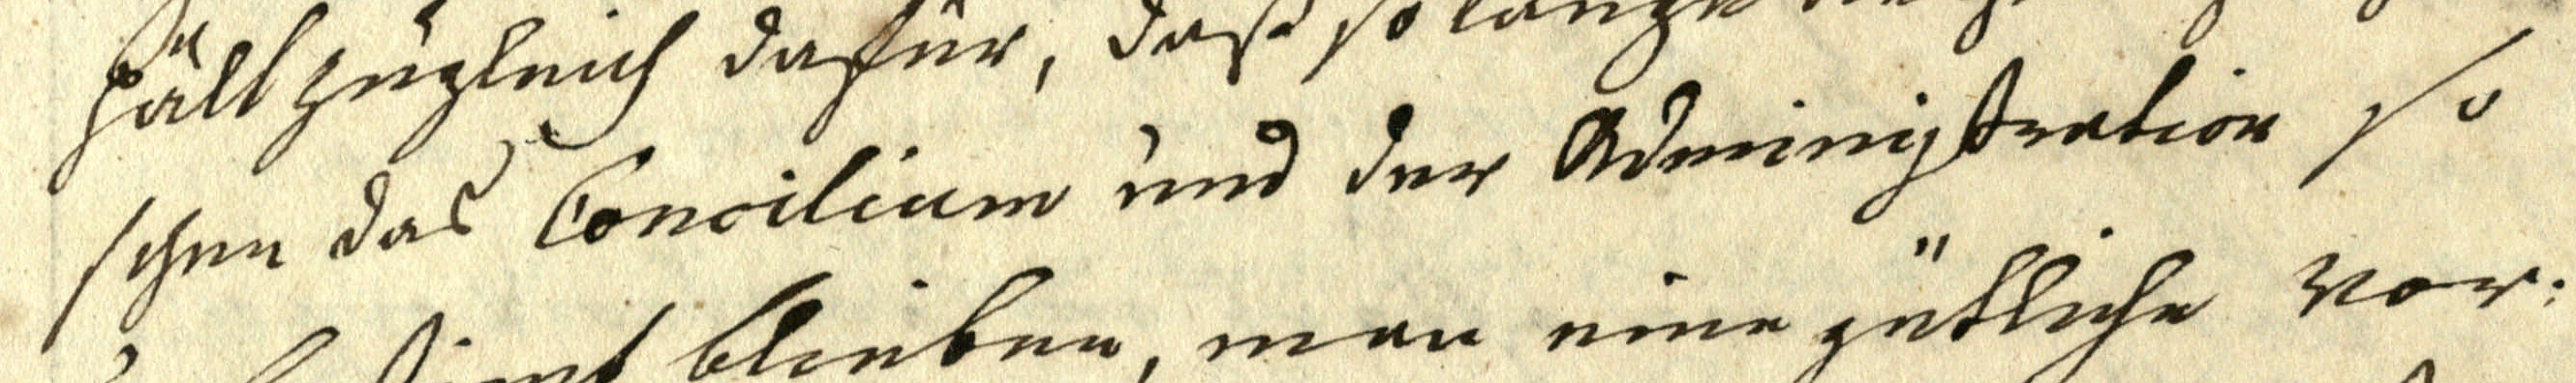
schen das Concilium und der Administration so
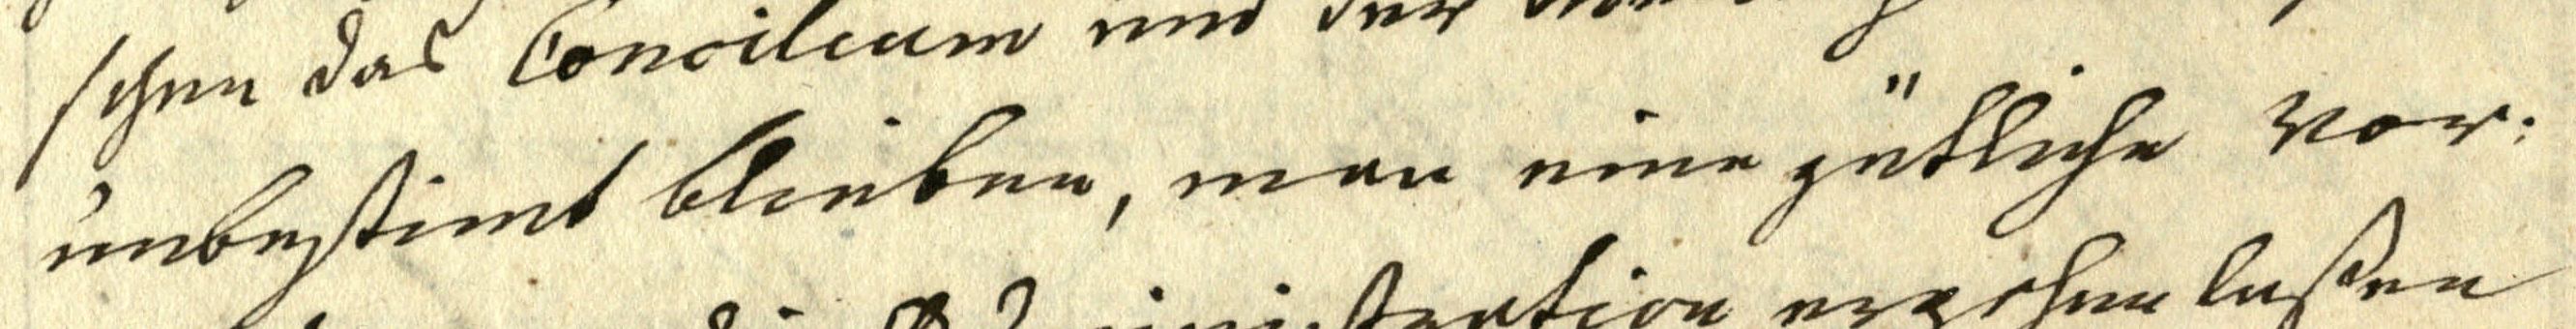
unbestimt blieben, man eine gütliche vor¬
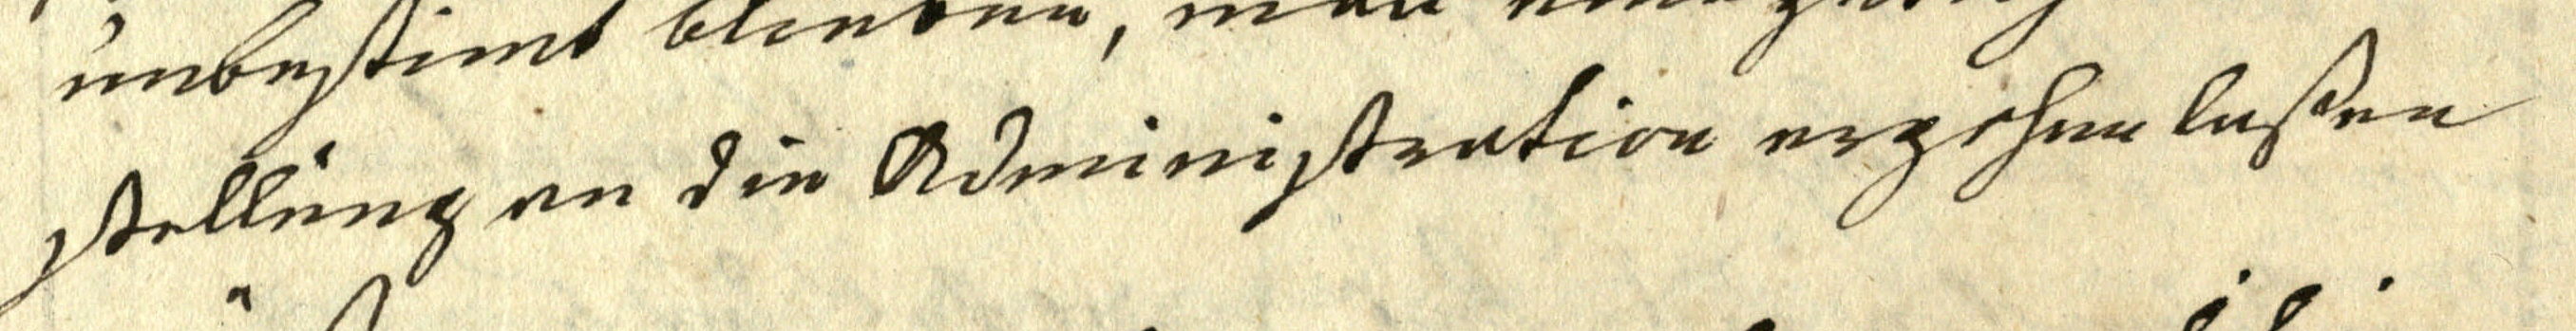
stellung an die Administration ergehen laßen
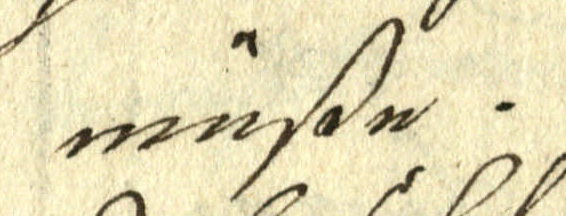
müße.
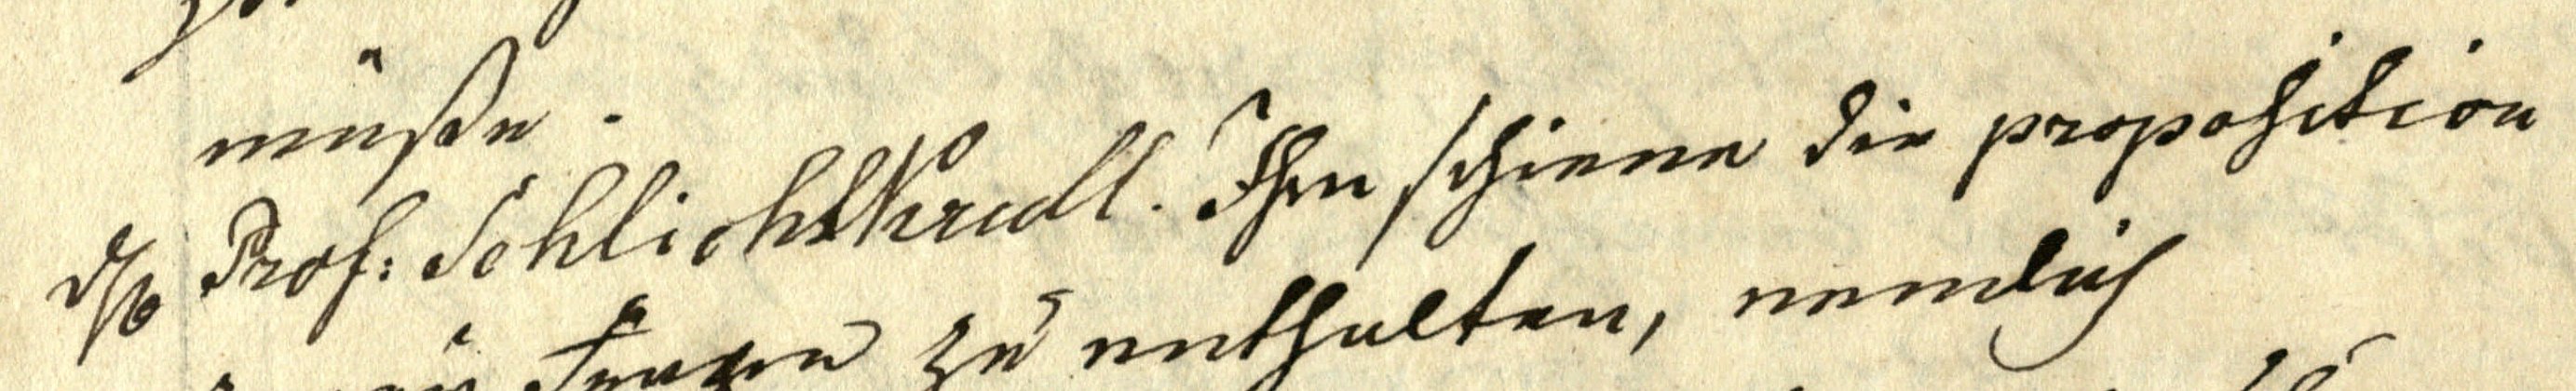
dh Prof. Schlichtkrull. Ihm schiene die proposition
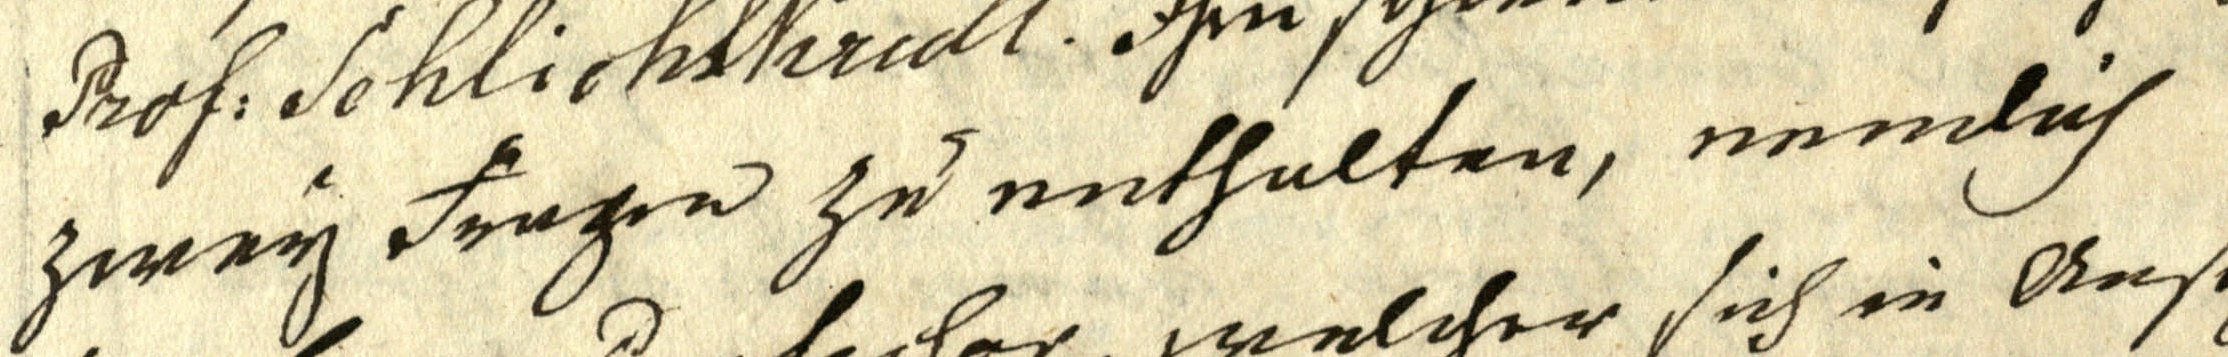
zweÿ Fragen zu enthalten, nemlich
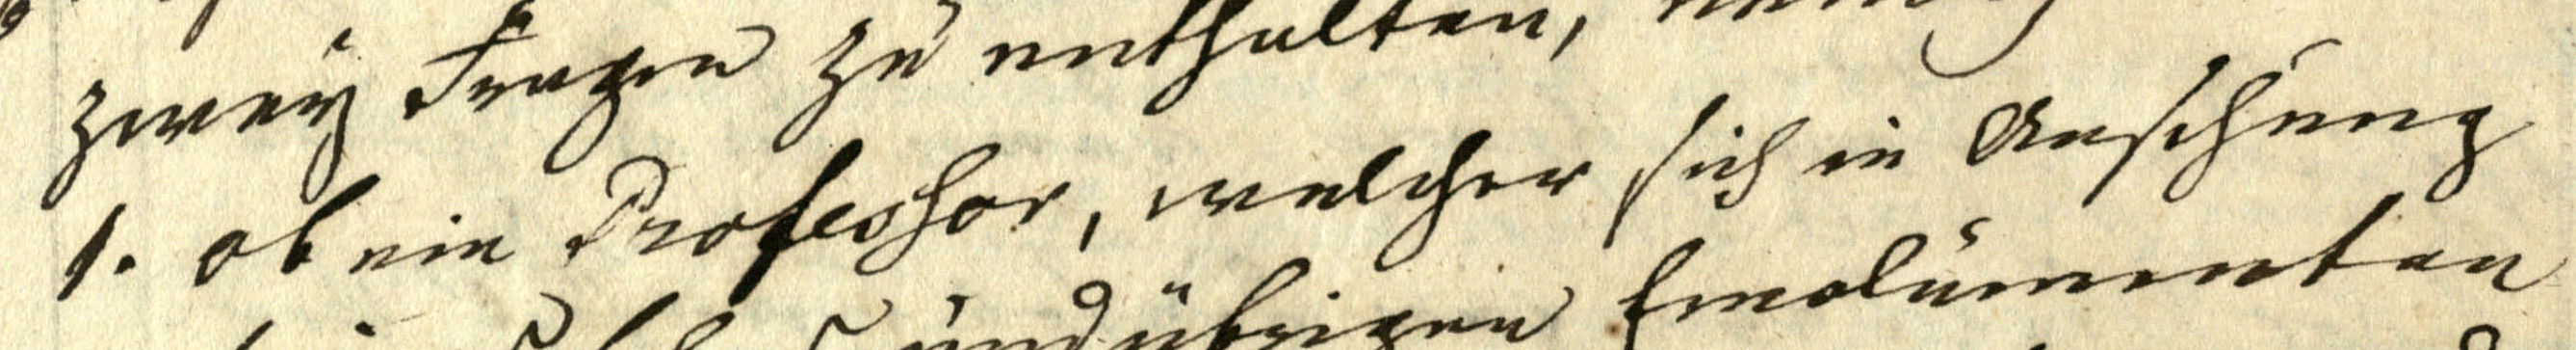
1. ob ein Professor, welcher sich in Ansehung
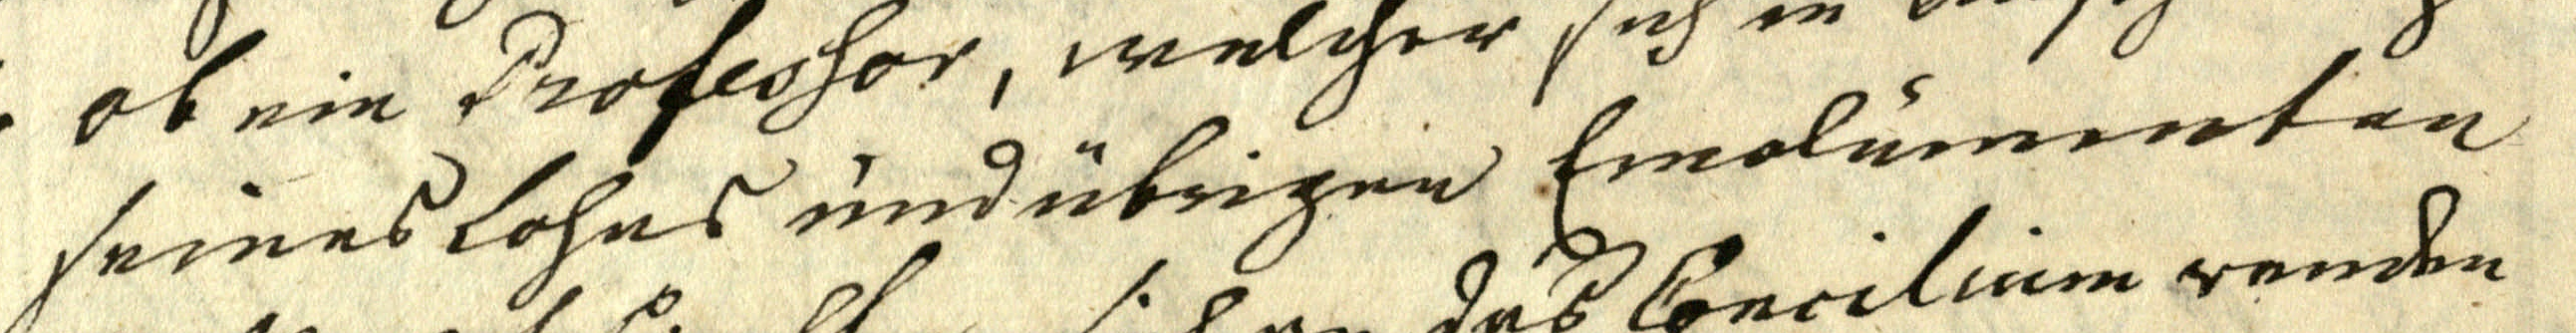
seines Lohns und übrigen Emolumenten
